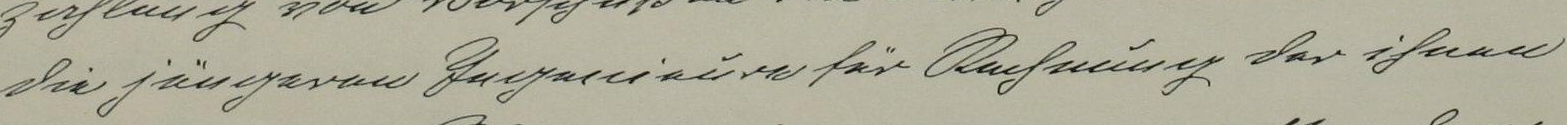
die jüngeren Ingenieure für Rechnung der ihnen
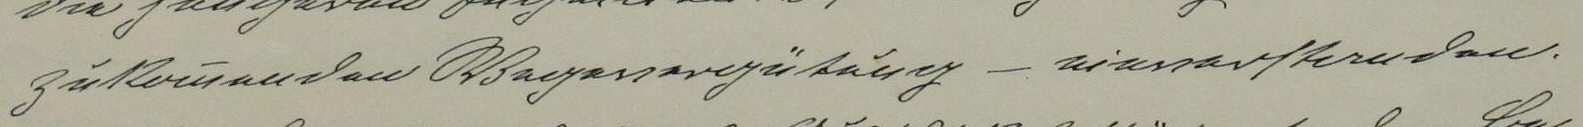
zukommenden Wegevergütung - einverstanden.
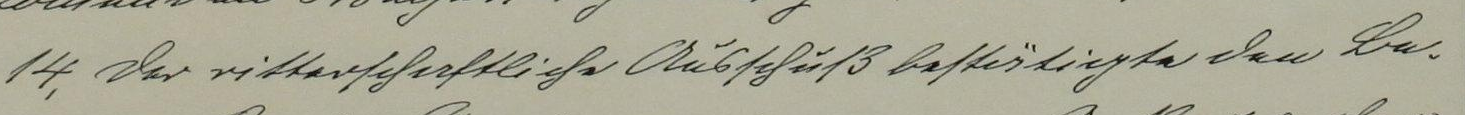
14. Der ritterschaftliche Ausschuß bestätigte den Be-
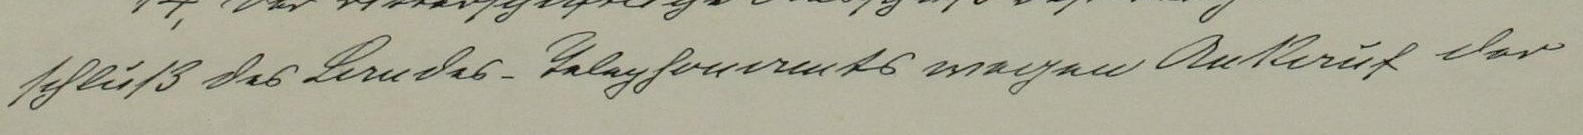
schluß des Landes-Telephonamts wegen Ankauf der
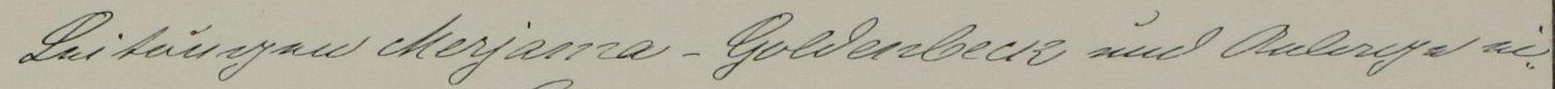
Leitungen Merjama – Goldenbeck und Anlage ei-
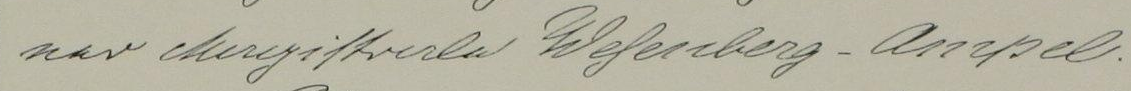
ner Magistrale Wesenberg – Ampel.
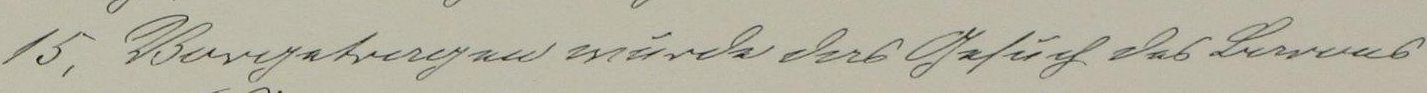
15. Vorgetragen wurde das Gesuch des Barons
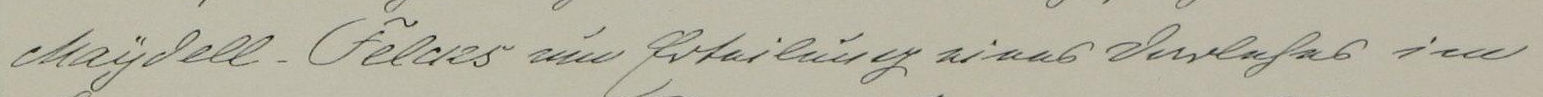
Maydell-Felcks um Erteilung eines Darlehns im
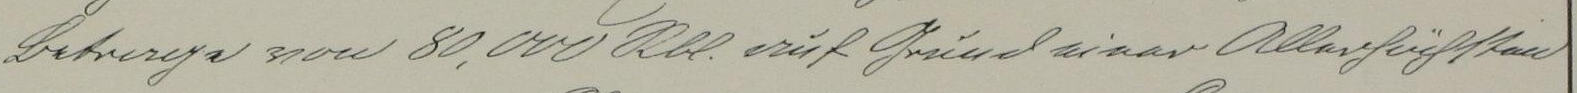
Betrage von 80.000 Rbl. auf Grund einer Allerhöchsten
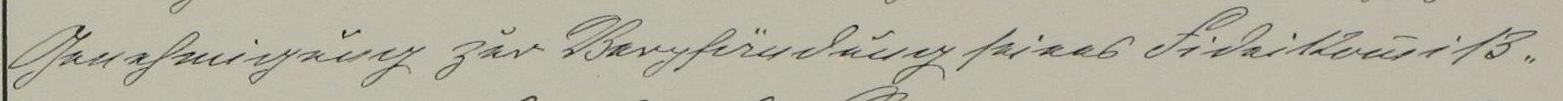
Genehmigung zur Verpfändung seines Fideikommiß-
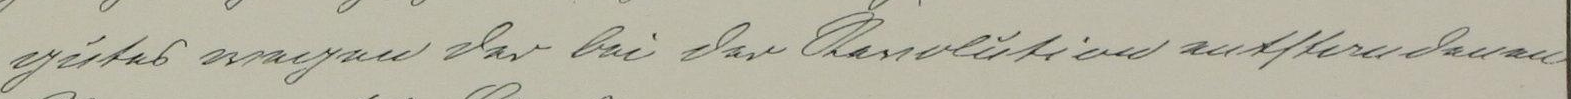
gutes wegen der bei der Revolution entstandenen
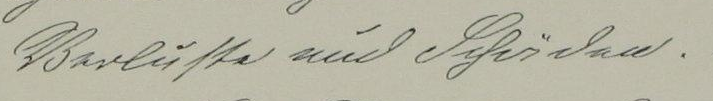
Verluste und Schäden.
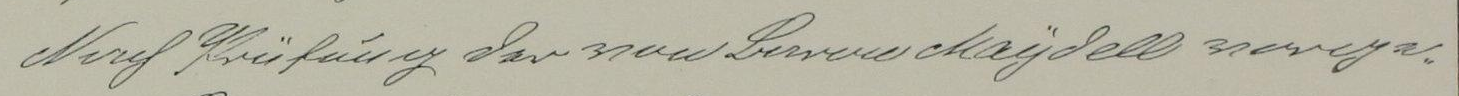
Nach Prüfung der von Baron Maydell vorge-
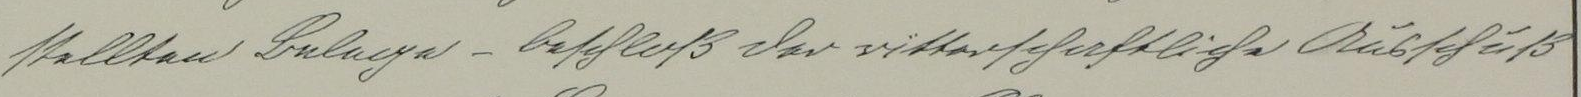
stellten Belege - beschloß der ritterschaftliche Ausschuß
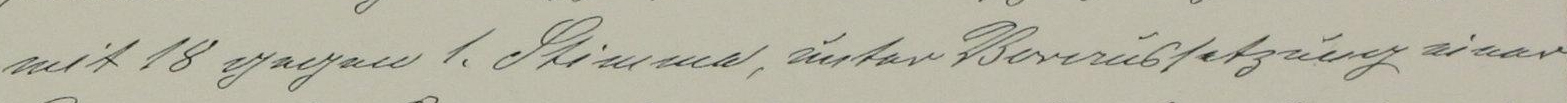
mit 18 gegen 1 Stimme, unter Voraussetzung einer
